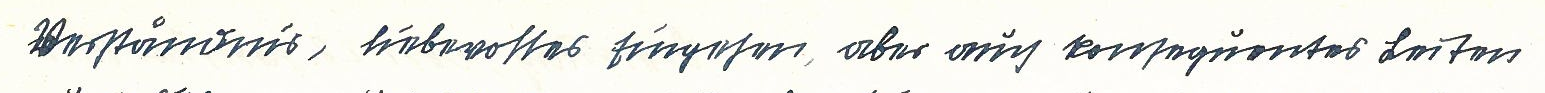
Verständnis, liebevolles Eingehen, aber auch konsequentes Leiten
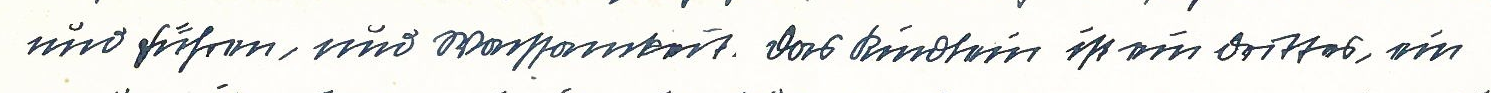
und Führen, und Wachsamkeit. Das Kindlein ist ein Drittes, ein
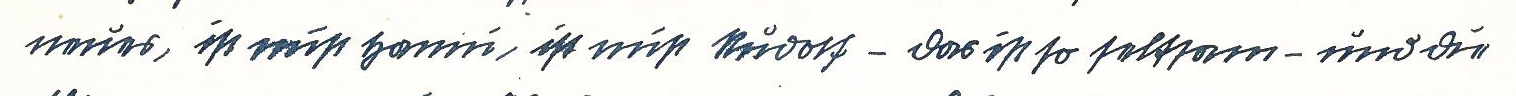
neues, ist nicht , ist nicht – das ist so seltsam – und die
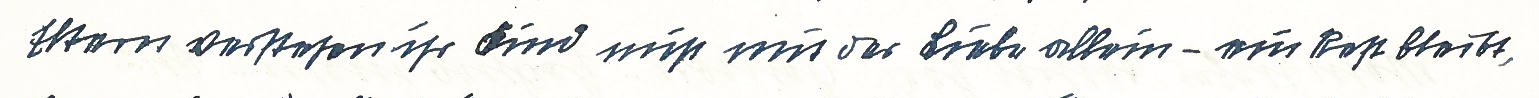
Eltern verstehen ihr Kind nicht mit der Liebe allein – ein Rest bleibt,
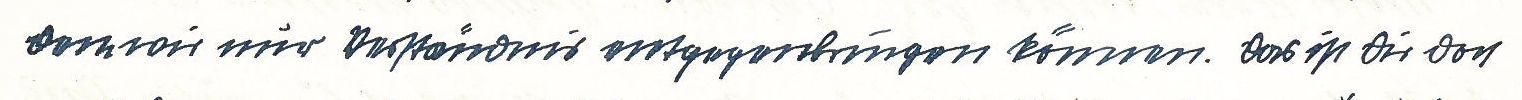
dem wir nur Verständnis entgegenbringen können. Das ist Dir doch
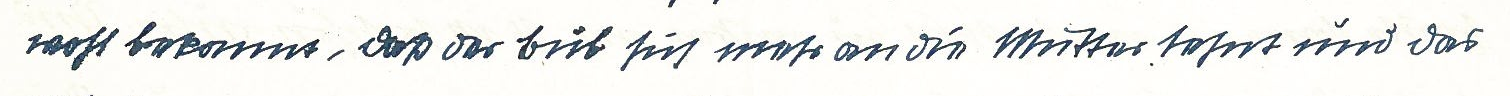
wohl bekannt, daß der Bub sich mehr an die Mutter lehnt und das
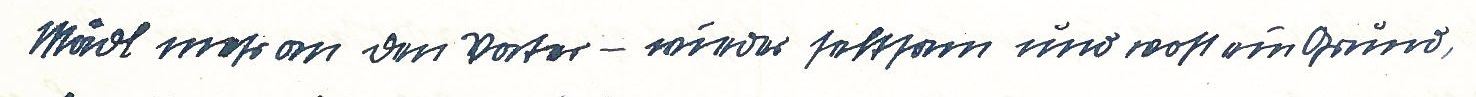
Mädl mehr an den Vater – wieder seltsam und wohl ein Grund,
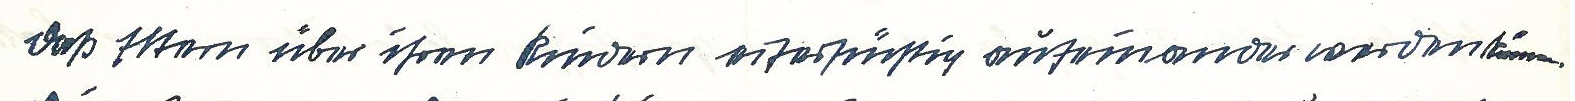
daß Eltern über ihren Kindern eifersüchtig aufeinander werden können.
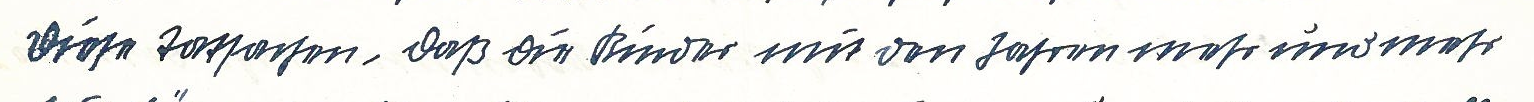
Diese Tatsachen, daß die Kinder mit den Jahren mehr und mehr
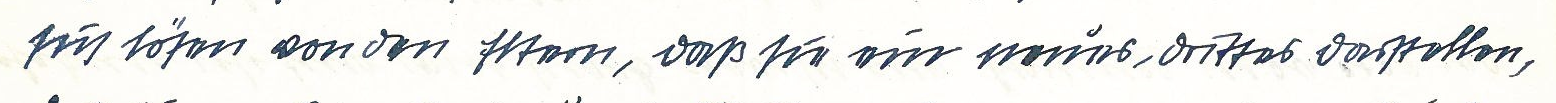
sich lösen von den Eltern, daß sie ein neues, Drittes darstellen,
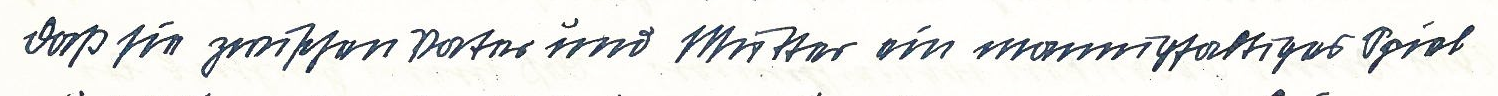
daß sie zwischen Vater und Mutter ein mannigfaltiges Spiel
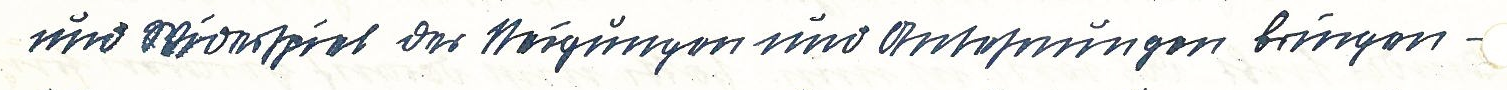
und Widerspiel der Neigungen und Anschauungen bringen –
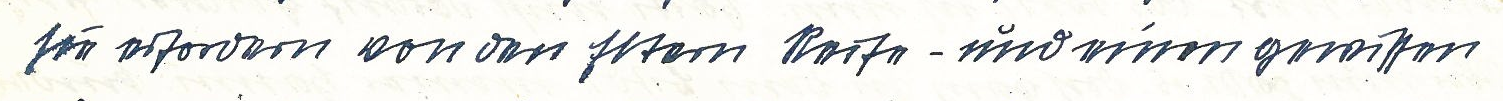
sie erfordern von den Eltern Reife – und einen gewissen
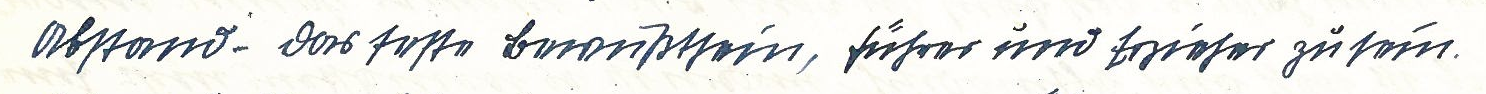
Abstand – das feste Bewußtsein, Führer und Erzieher zu sein.
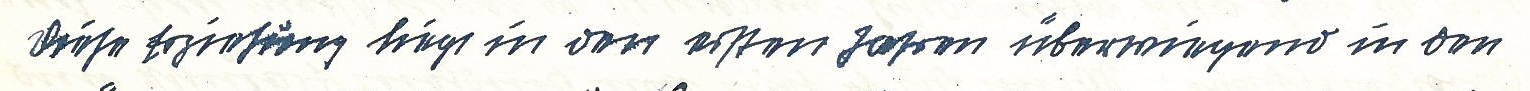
Die Erziehung liegt in den ersten Jahren überwiegend in den
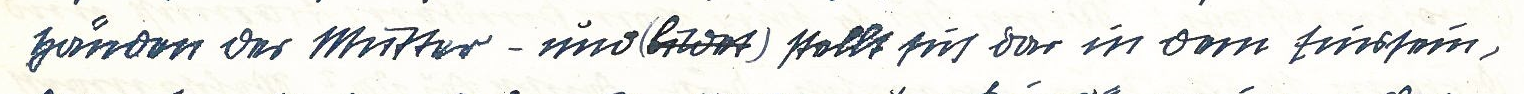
Händen der Mutter – und (bildet) stellt sich dar in dem Einssein,
